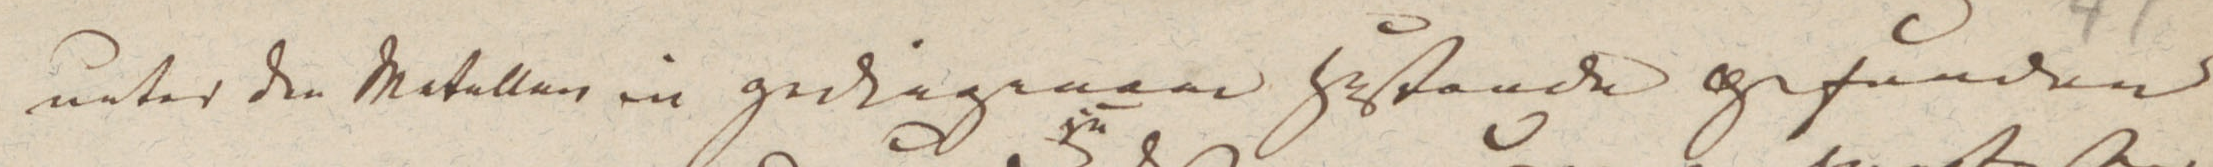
unter den Metallen in gediegenem Zustande gefunden
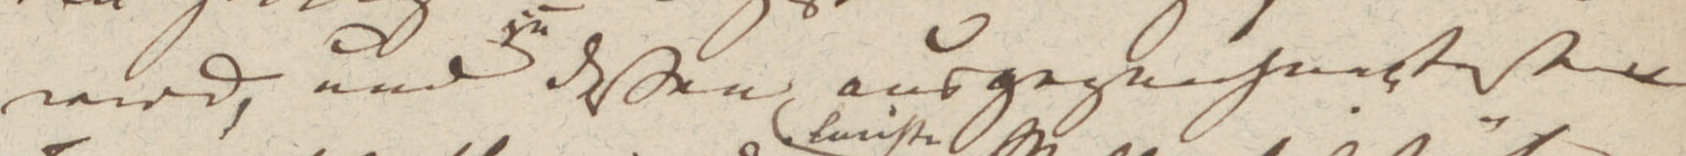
wird, und zu dessen ausgezeichnetesten
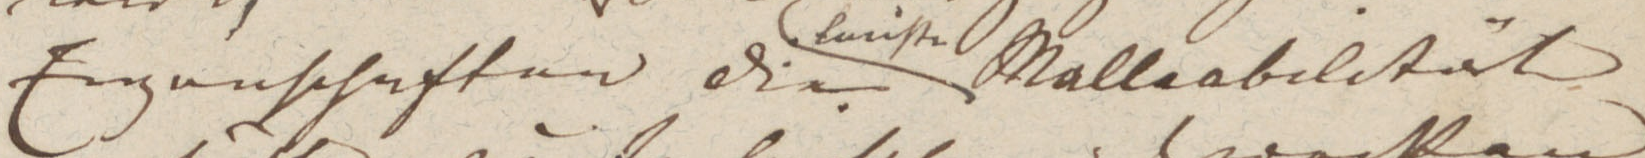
Eigenschaften die leichte Malleabilität
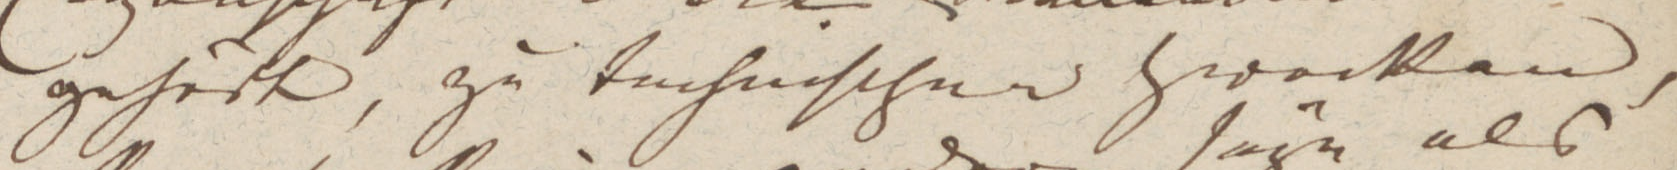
gehört, zu technischen Zwecken,
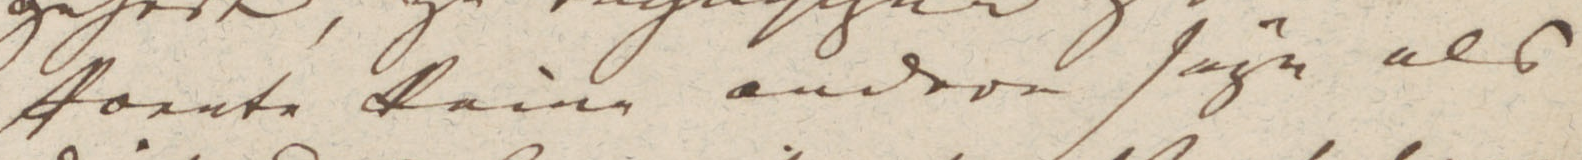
konnte keine andere seyn als
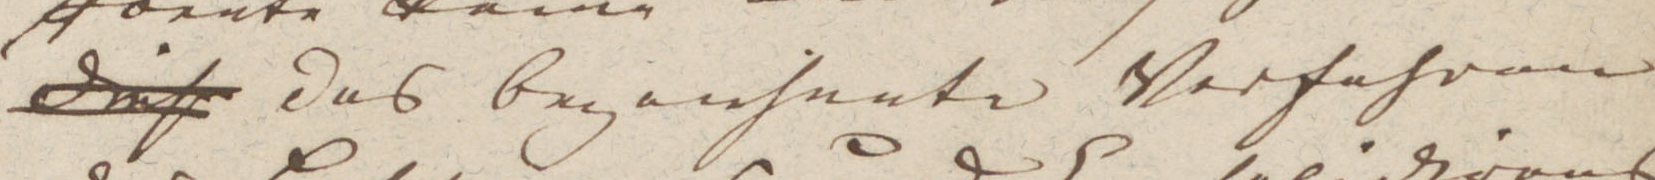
dies das bezeichnete Verfahren
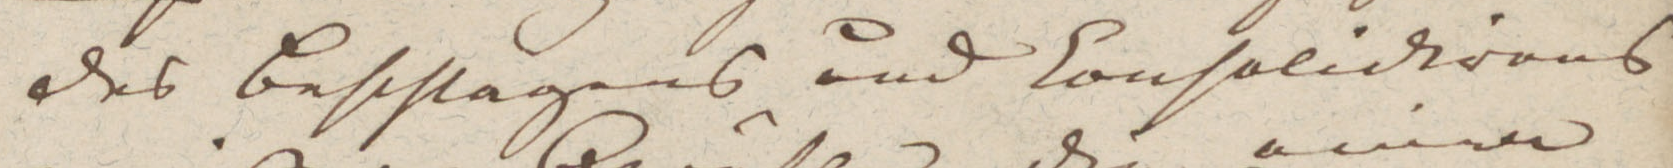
des Beschlagens und Consolidirens
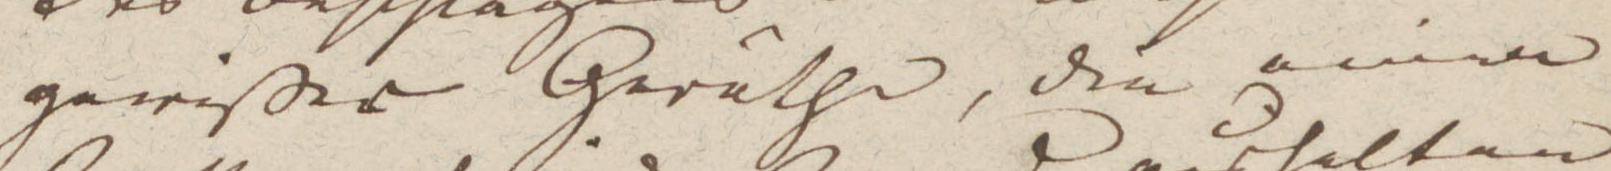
gewisser Geräthe, die einen
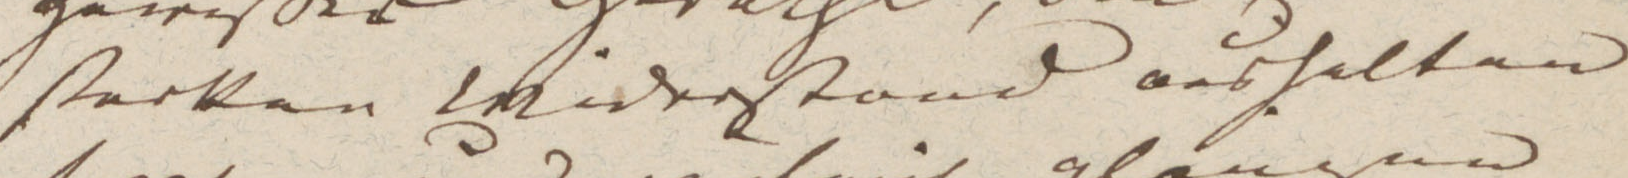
starken Widerstand aushalten
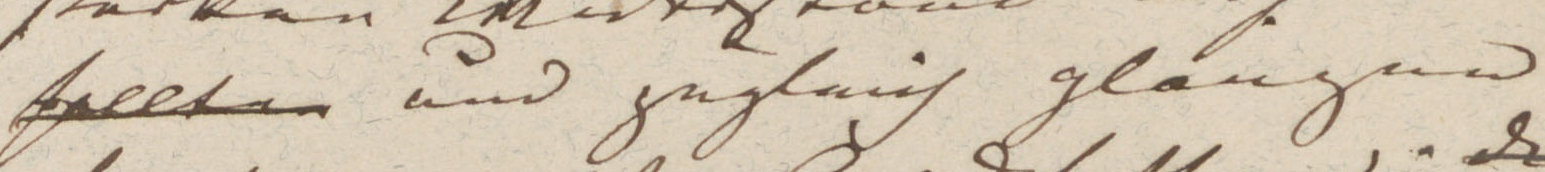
sollten und zugleich glänzen
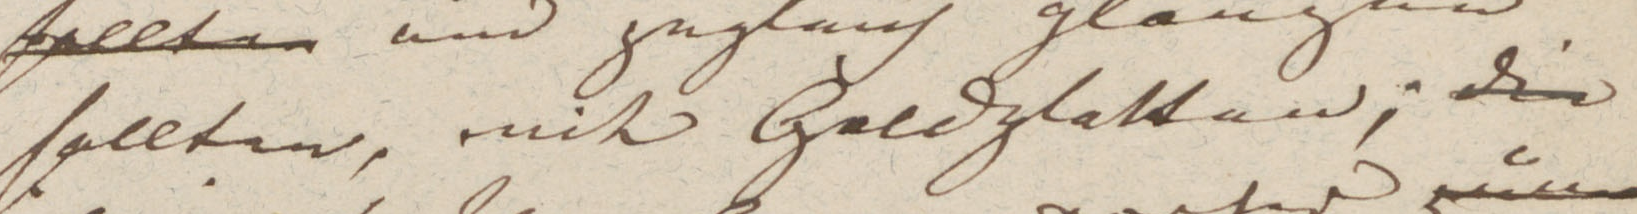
sollten, mit Goldplatten; die
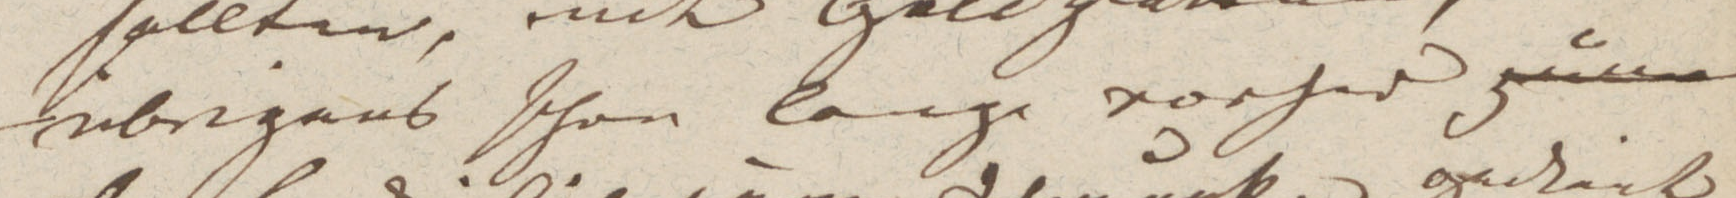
übrigens schon lange vorher zum
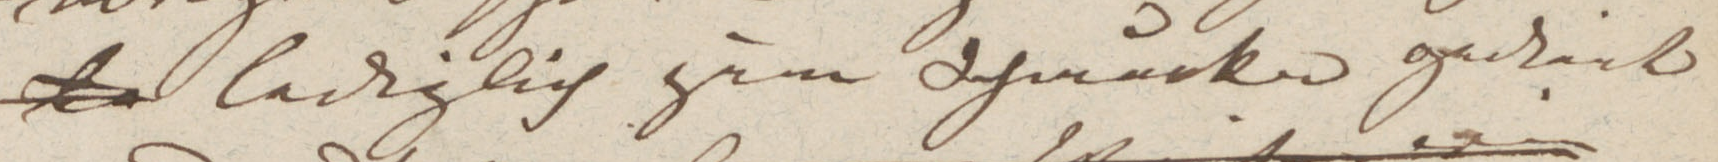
le lediglich zum Schmucke gedient
